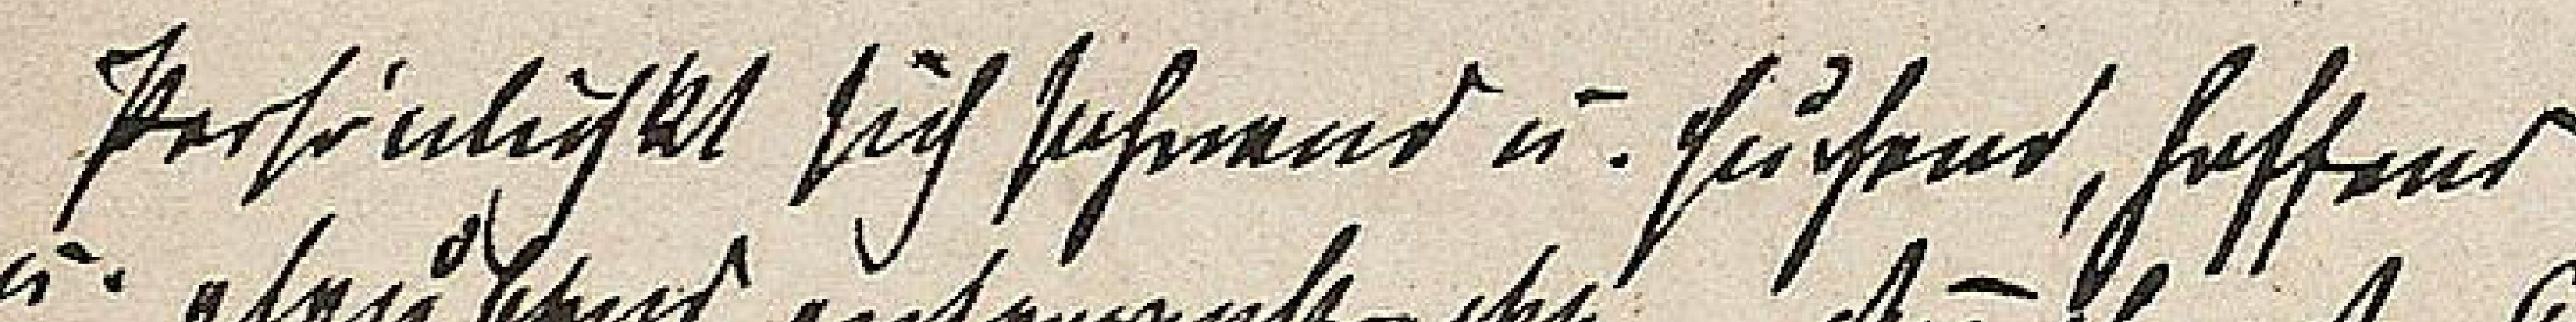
Persönlichkt sich sehnend u. suchend, hoffend
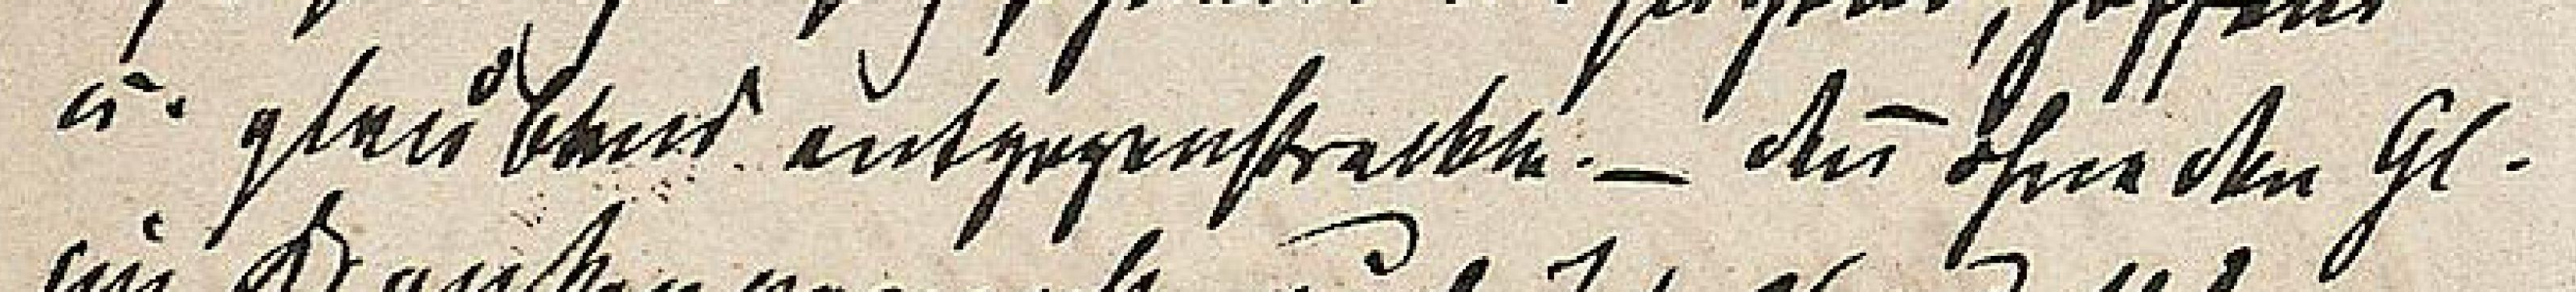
u. glaubend entgegenzustrecken. _ den ohne den Gl¬
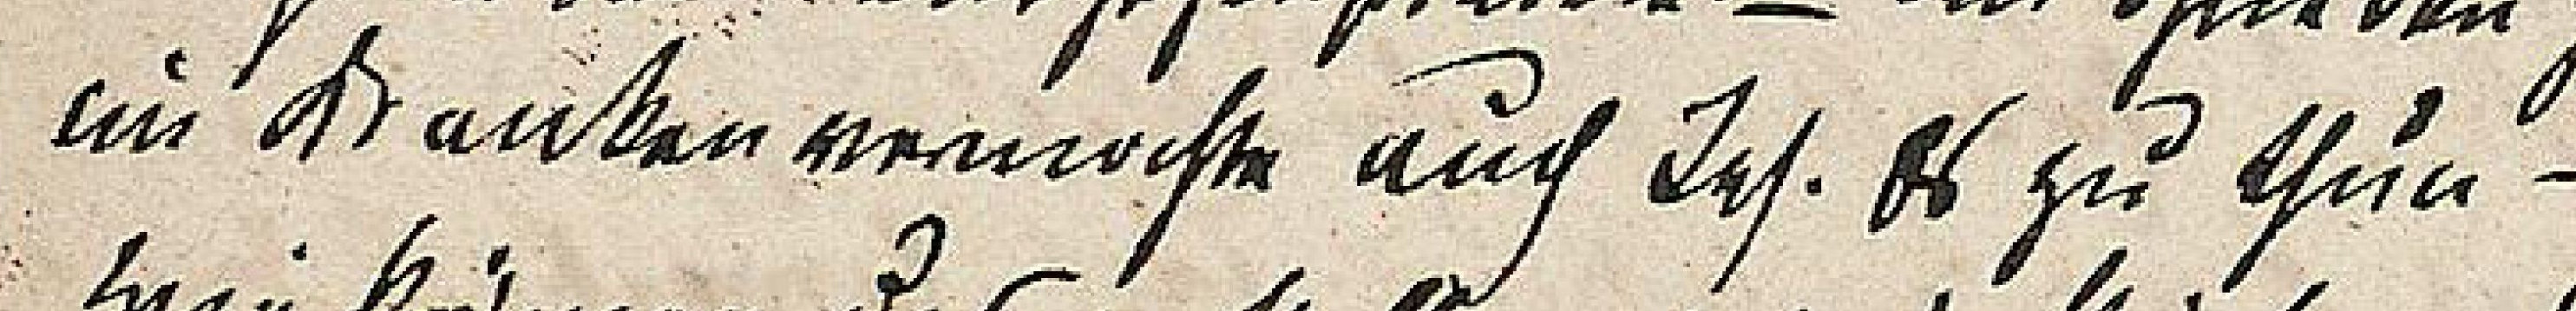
im Kranken vermochte auch Jes. os zu thun _
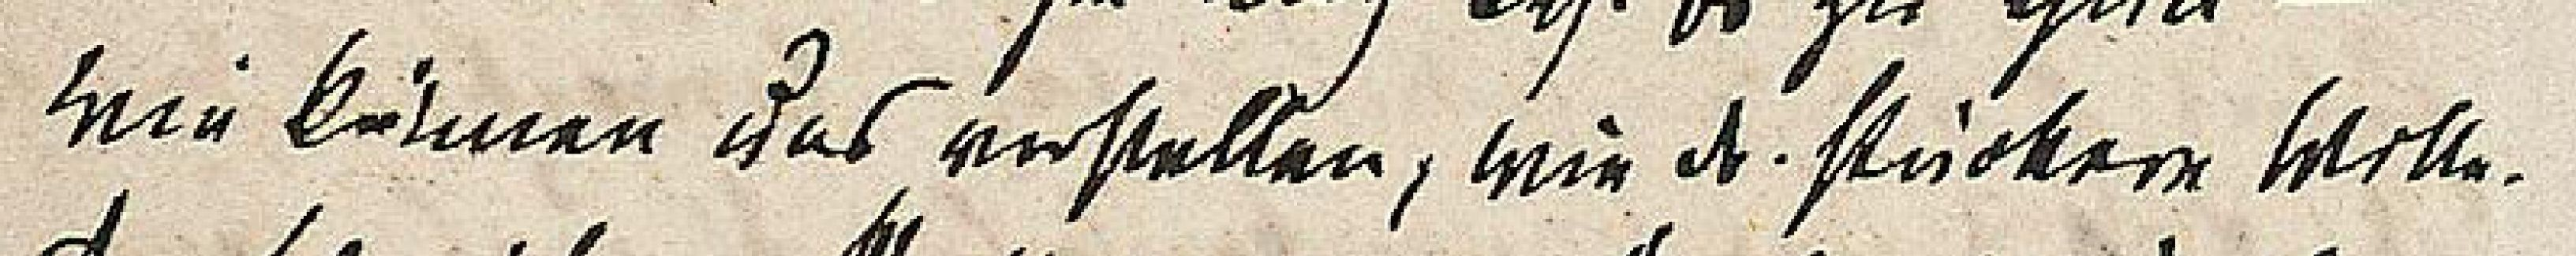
wir können uns vorstellen, wie dr. stärkere Wille.
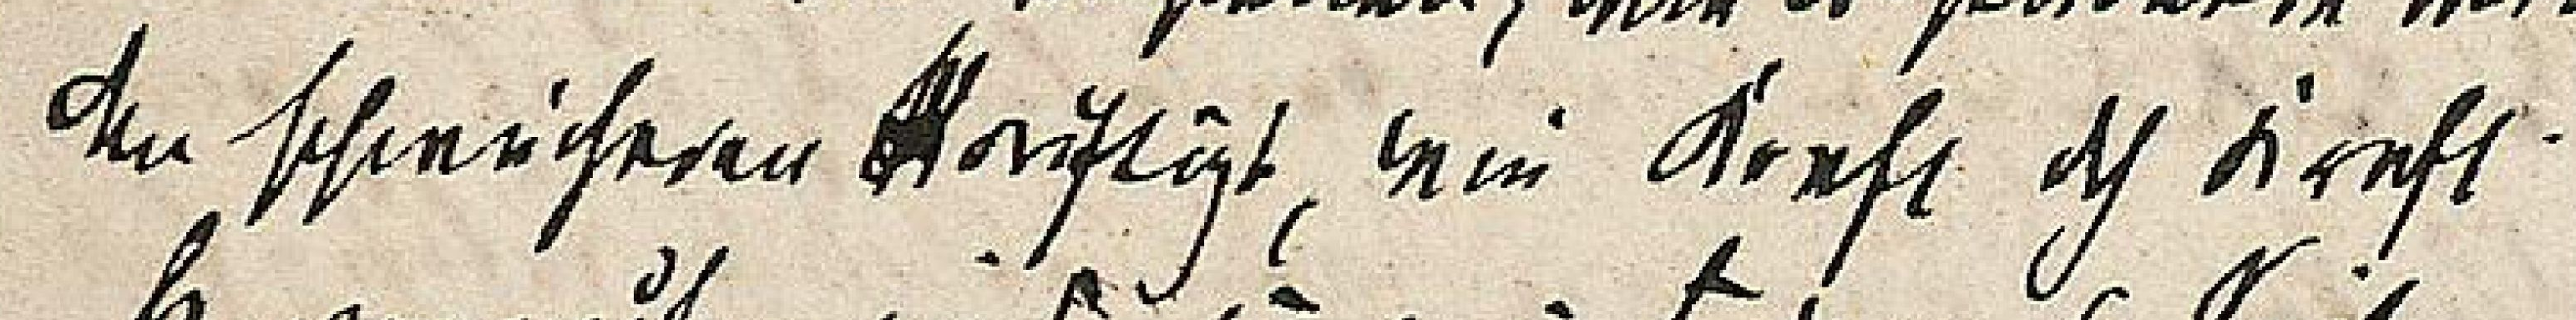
den schwächeren kräftigt, wie Kraft dch Kraft
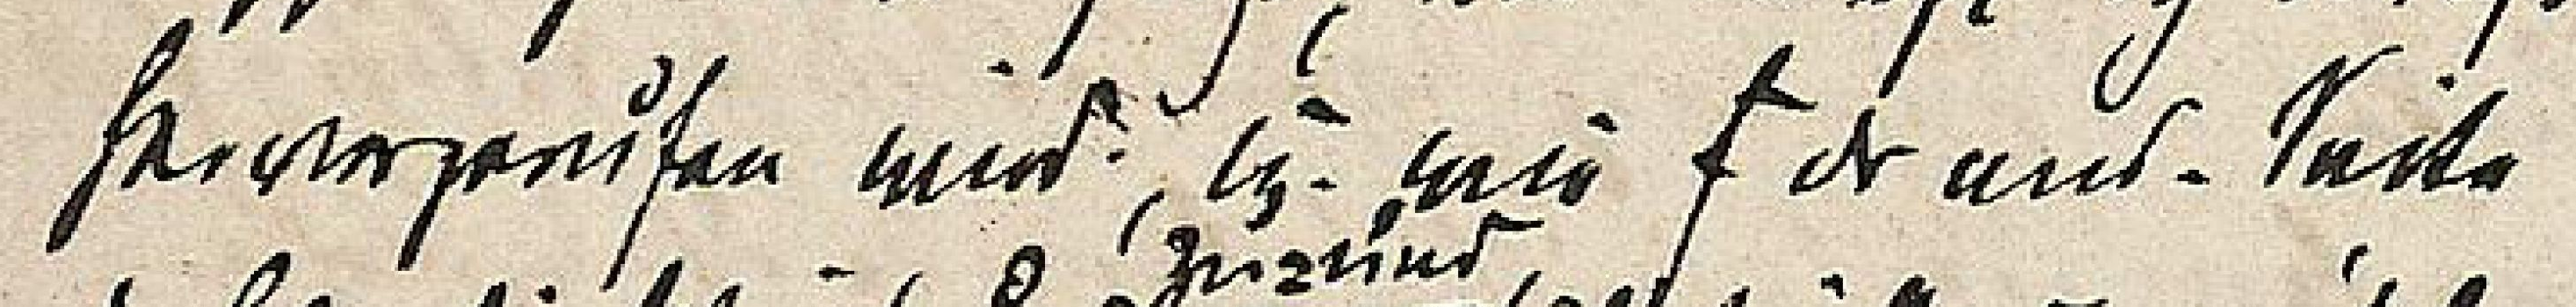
hevergerufen wird; u. wie f dr and. Seite
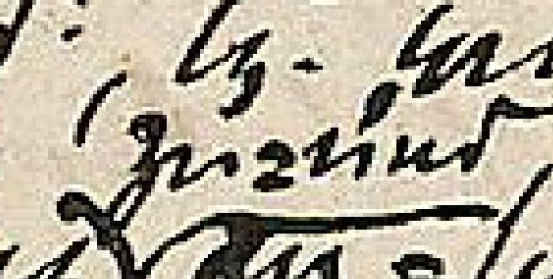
zu- und
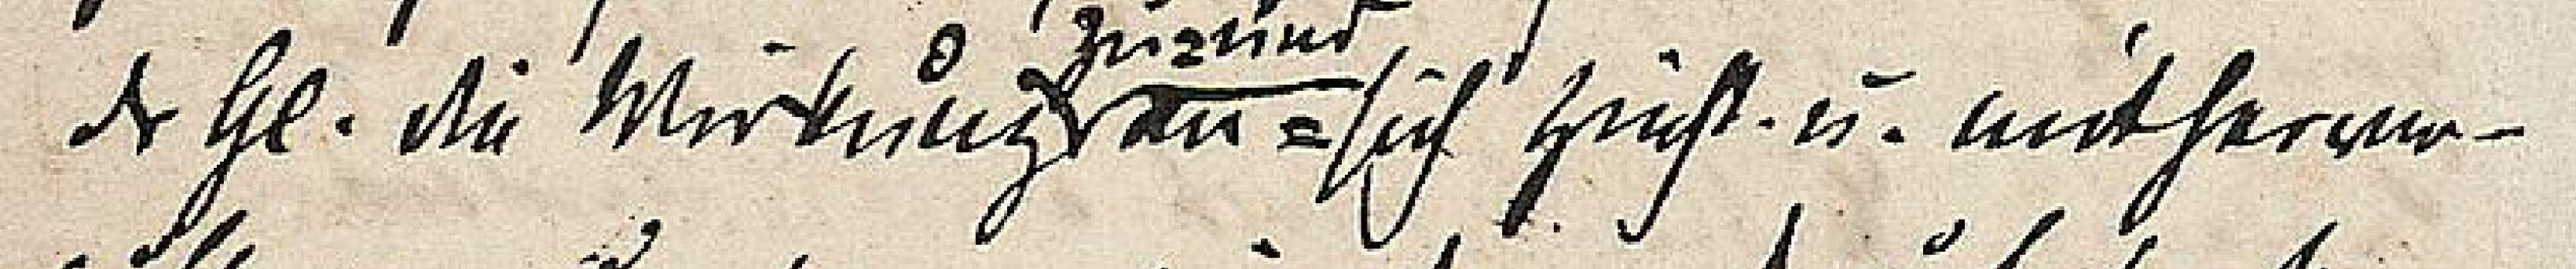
der Gl. die Wirkung zu sich zieht u. mithervor¬
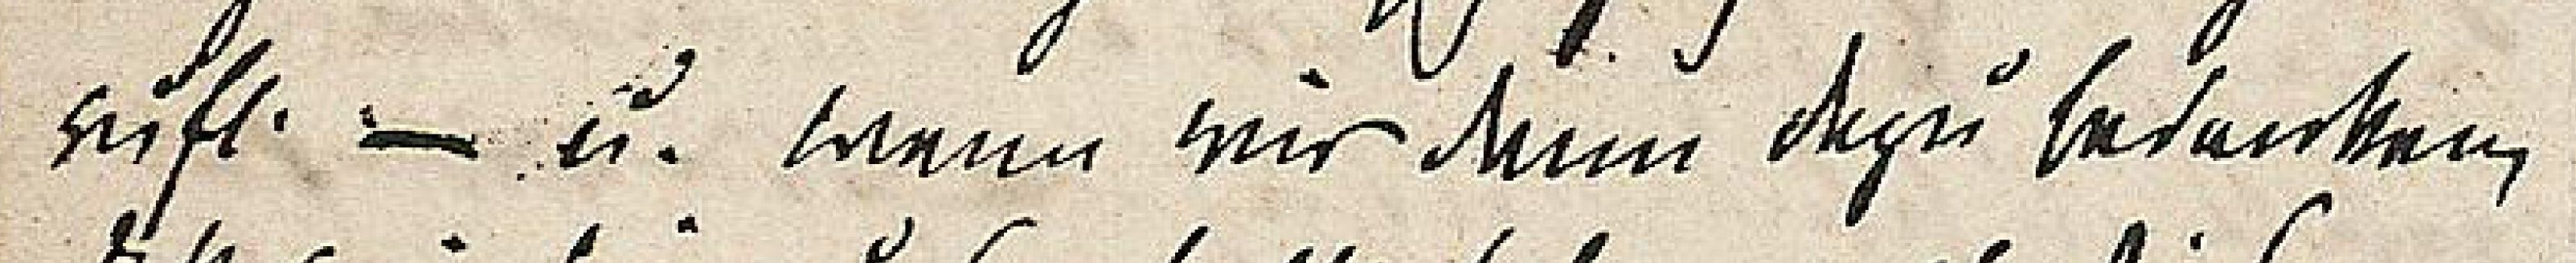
ruft. _ u. wenn wir dann dazu bedenken,
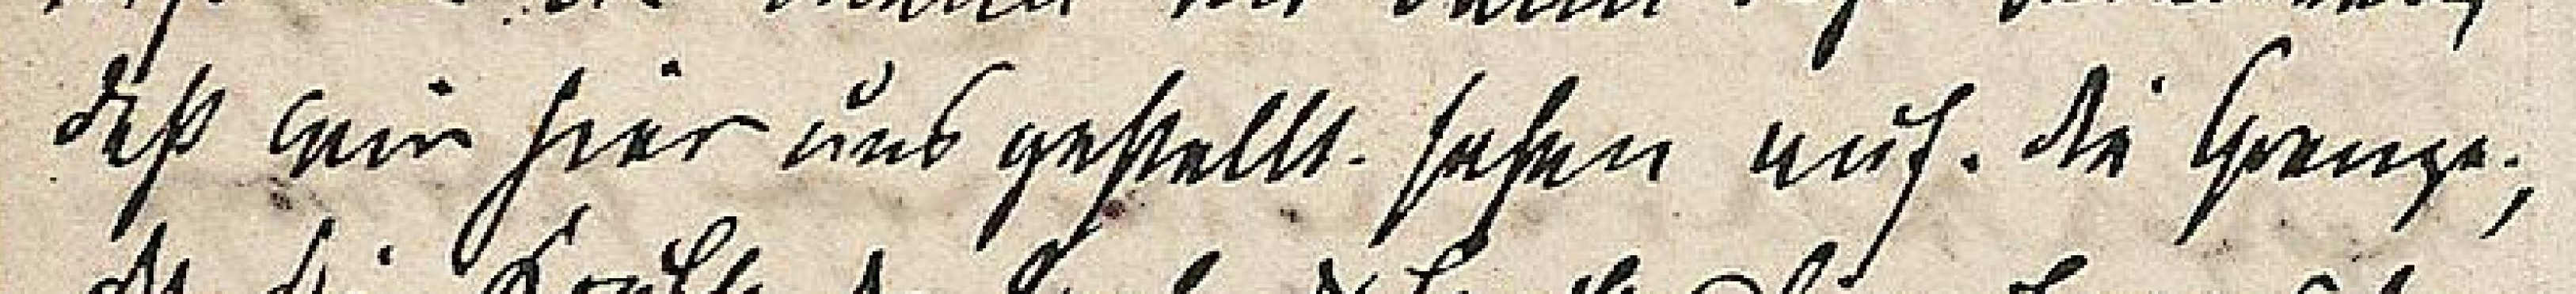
daß wir hier uns gestellt sehen auf die Grenze,
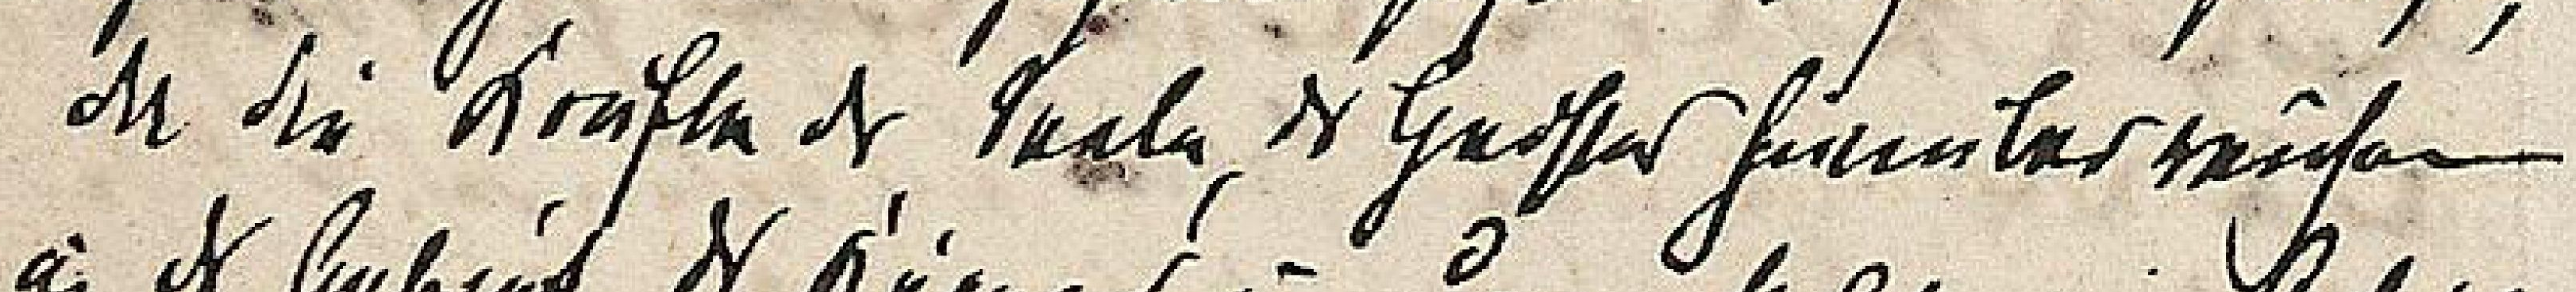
da die Kräfte der Seele, des Geistes hinüberreichen
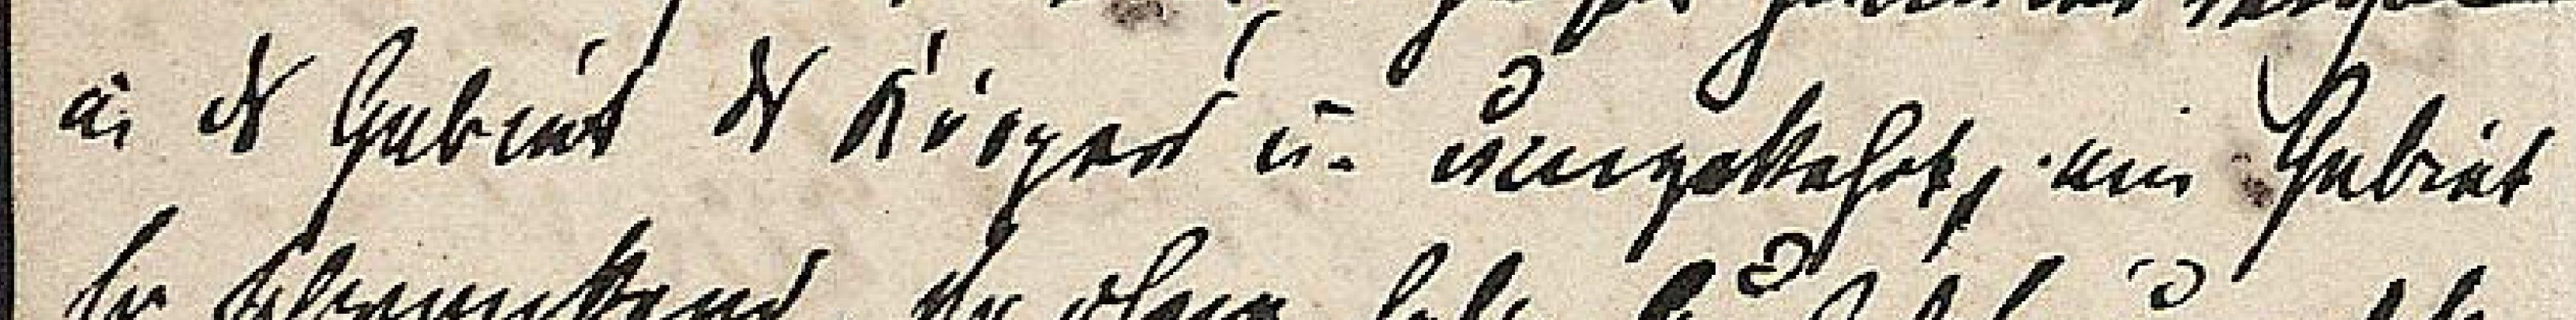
in des Gebiet des Körpers u. umgekehrt, ein Gebiet
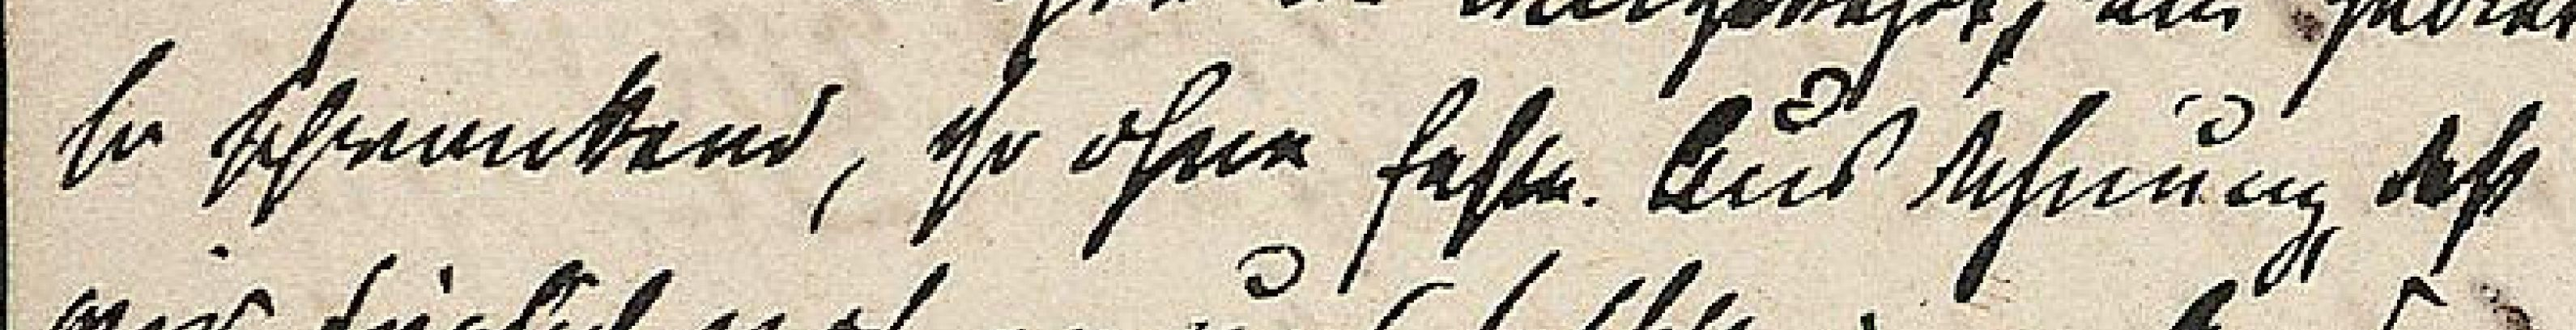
so schwanktend, so ohne fehle. Ausdehnung, daß
